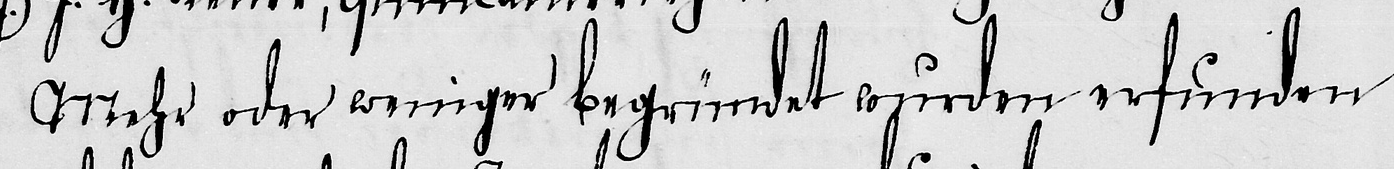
Mehr oder weniger begründet wurden erfunden
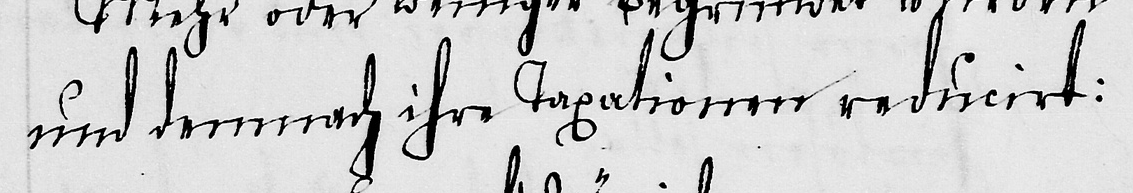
und demnach ihre Taxationen reducirt:
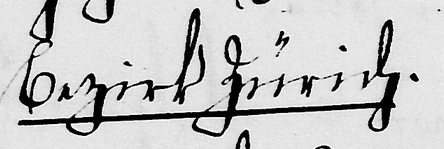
Bezirk Zürich.
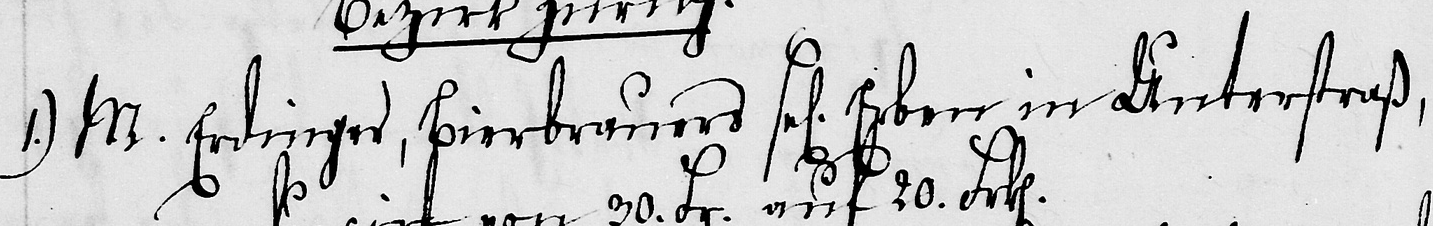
1.) M. Erdinger, Bierbauers sel. Erben in Unterstraß,
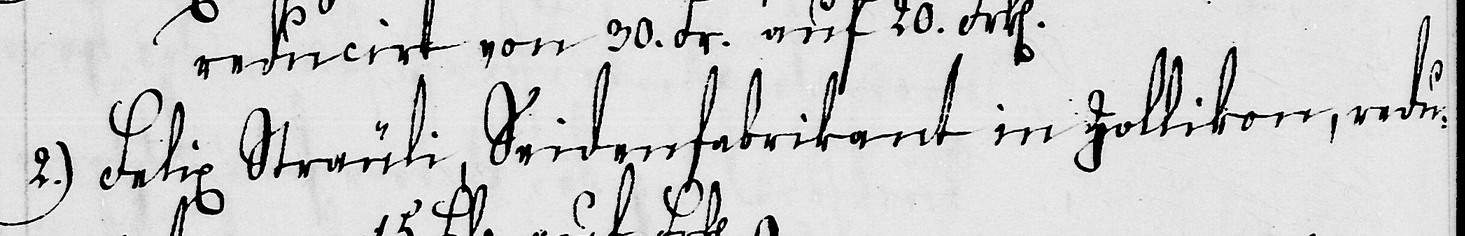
2.) Felix Sträuli, Seidenfabrikant in Zollikon, re¬
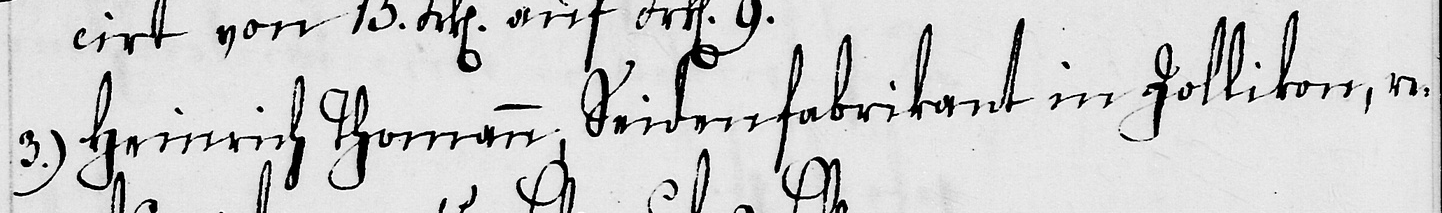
3.) Heinrich Thomann; Seidenfabrikant in Zollikon,
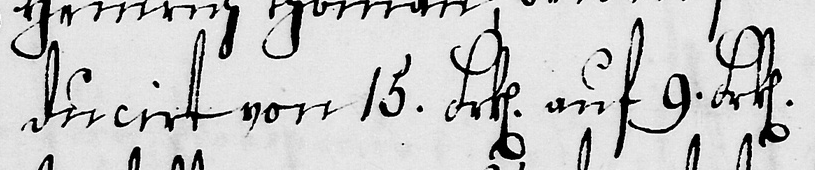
ducirt von 15. Frk[en]. auf 9.
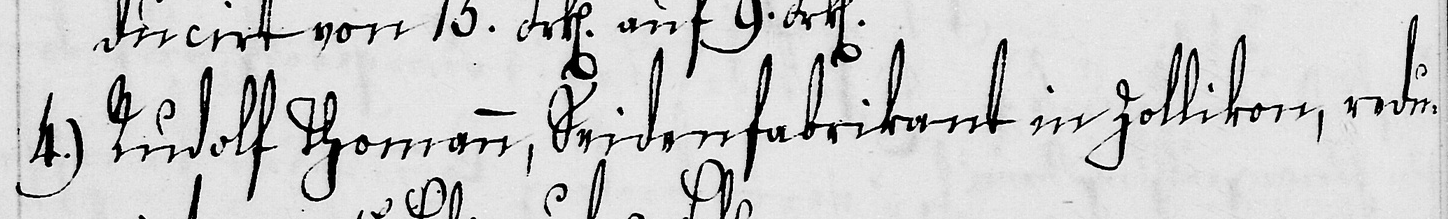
4.) Rudolf Thommann, Seidenfrabrikant in Zollikon, re¬
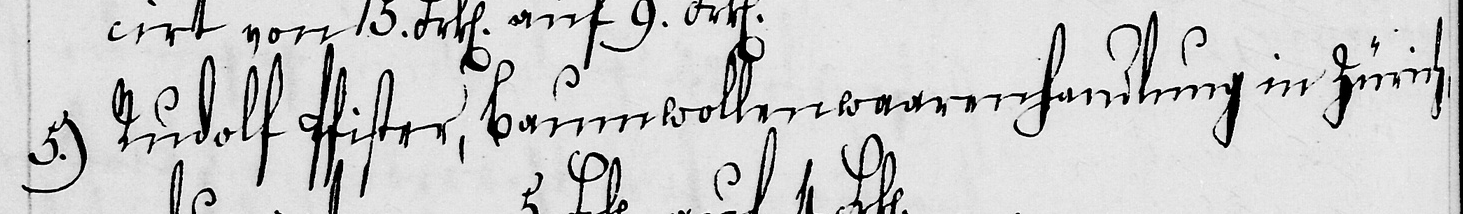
5.) Rudolf Pfister, Baumwollenwaarenhandlung in Zürich
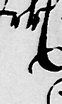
5.
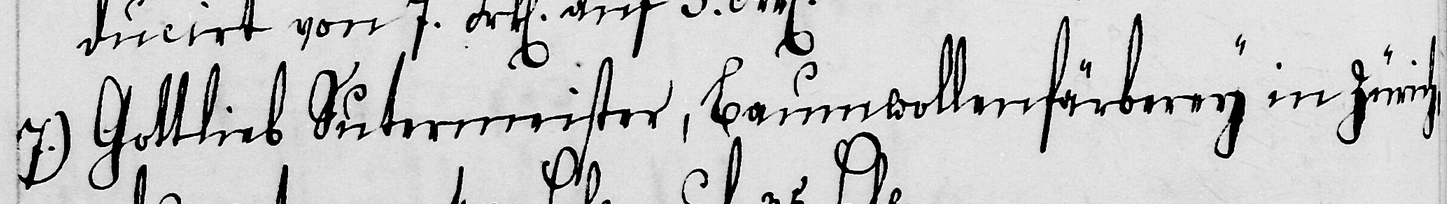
7.) Gottlieb Sutermeister, Baumwollenfärberey in Züri¬
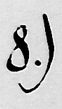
35.
